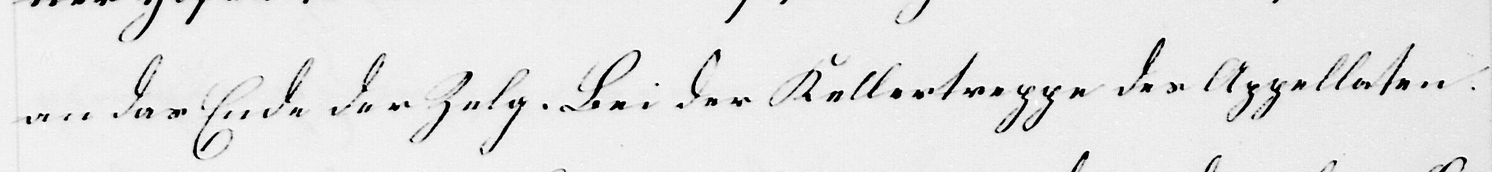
an das Ende der Zelg. Bei der Kellertreppe des Appellaten
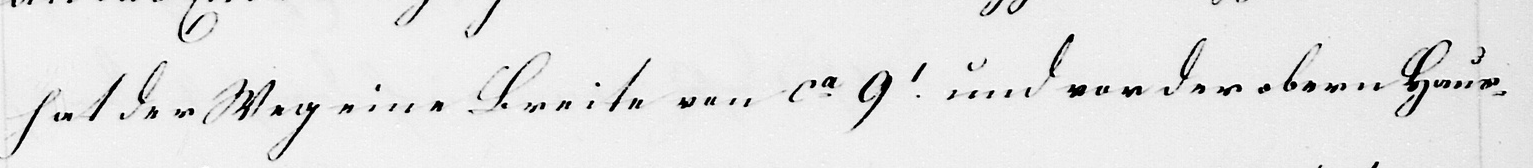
hat der Weg eine Breite von ca 9 [Fuss] und vor der obern Haus¬
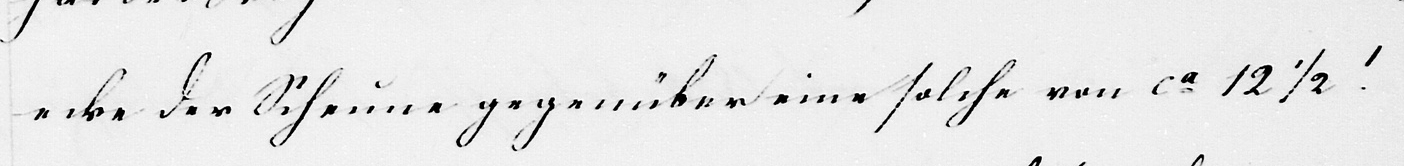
ecke der Scheune gegenüber eine solche von ca 12 ½
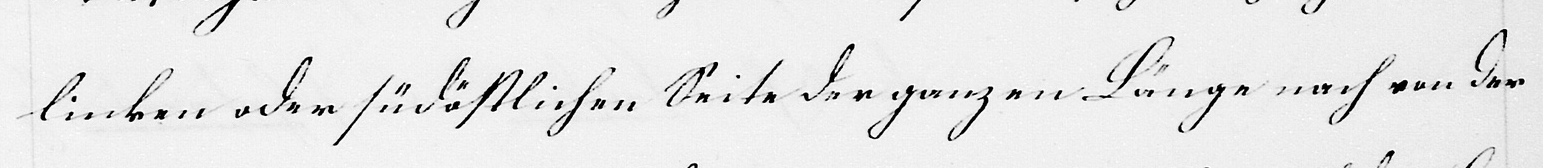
linken oder südöstlichen Seite der ganzen Länge nach von der
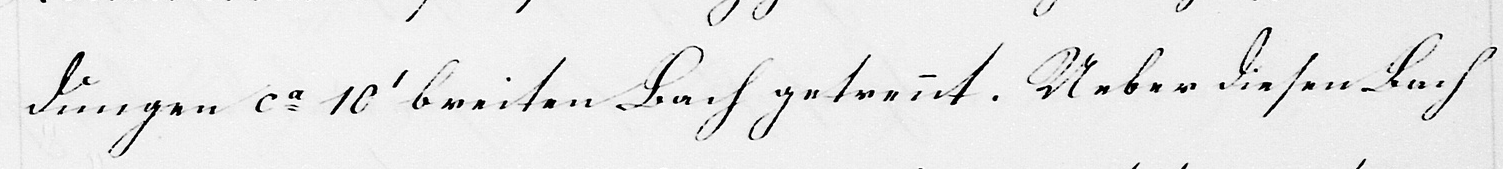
dungen ca 10 [Fuss] breiten Bach getrennt. Ueber diesen Bach
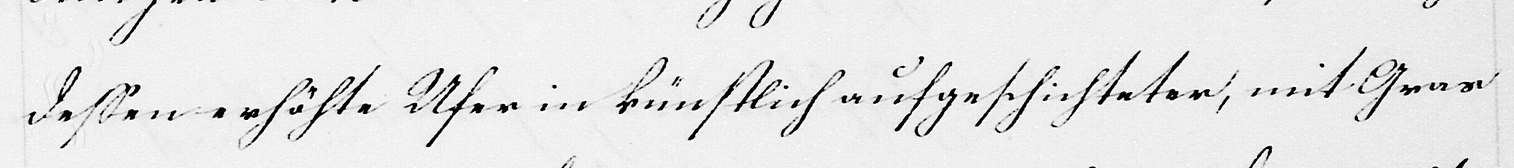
deßen erhöhte Ufer in künstlich aufgeschichteter, mit Gras
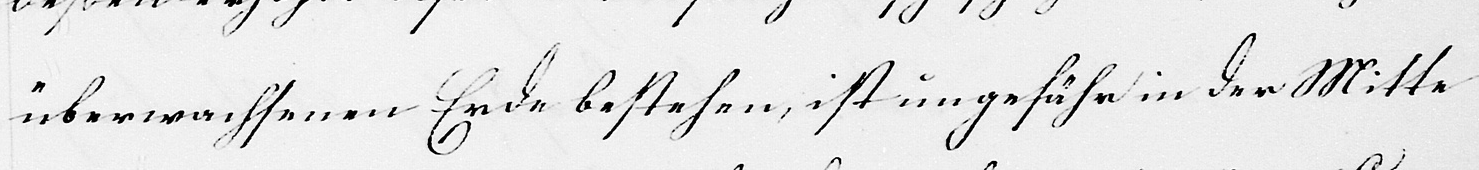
überwachsenen Erde bestehen, ist ungefähr in der Mitte
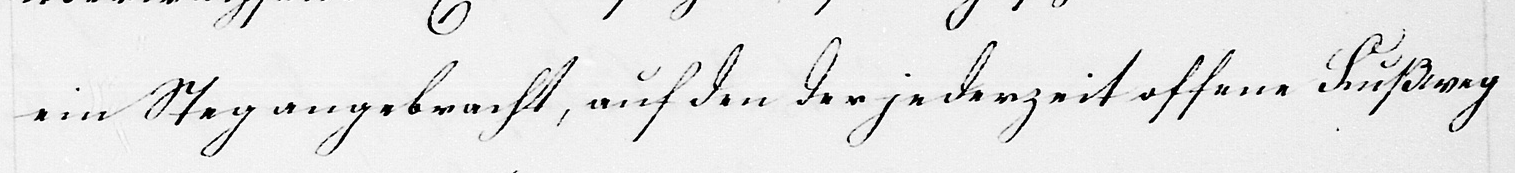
ein Steg angebracht, auf den der jederzeit offene Fußweg
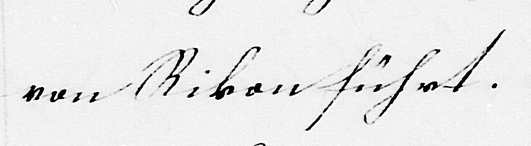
von Rikon führt.
